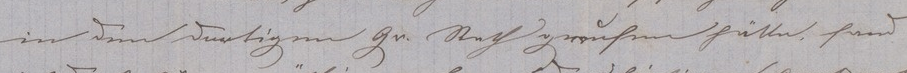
in den dortigen Gr. Rath gerufen hätte, fand
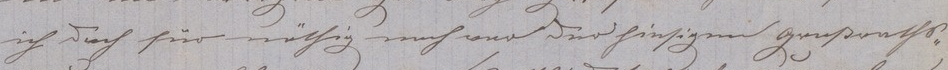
ich doch für nöthig noch vor der hiesigen Großraths-
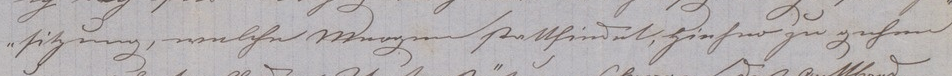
sitzung, welche Morgen stattfindet, hieher zu gehen
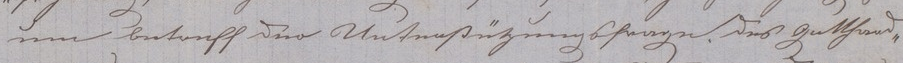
um betreff der Unterstützungsfrage des Gotthard -
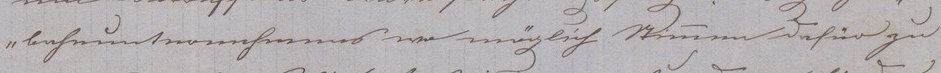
bahnunternehmens wo möglich Stimmen dafür zu
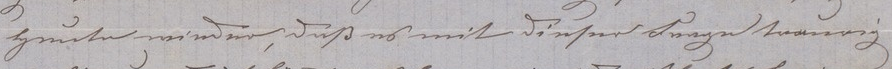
heute wieder, daß es mit dieser Frage traurig
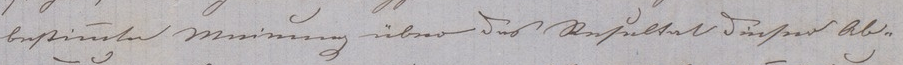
bestimmte Meinung über das Resultat dieser Ab-
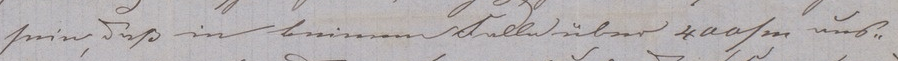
sein, daß in keinem Falle über 400/m aus-
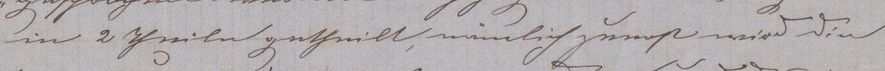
in 2 Theile getheilt, nämlich zuerst wird die
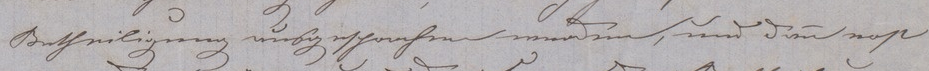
Betheiligung ausgesprochen werden, und dann erst
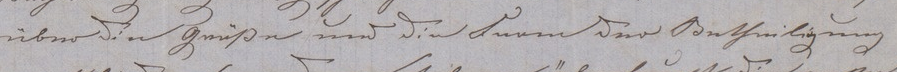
über die Größe und die Form der Betheiligung
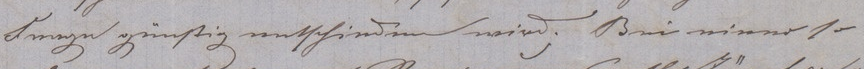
Frage günstig entschieden wird. Bei einer so
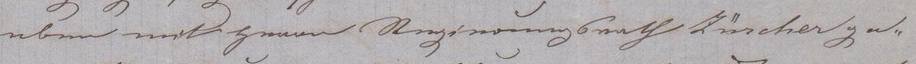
eben mit Herrn Regierungsrath Zürcher ge-
